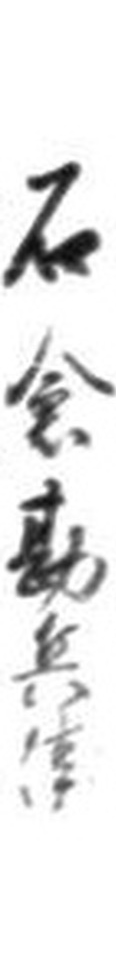石倉勘兵衛
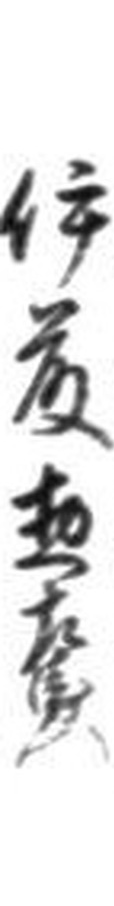伊藤惣左衛門
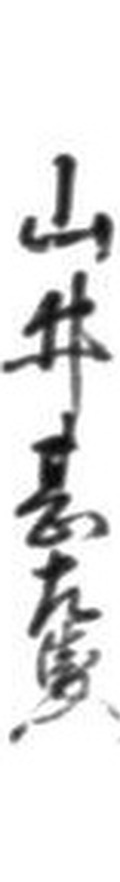山井甚左衛門

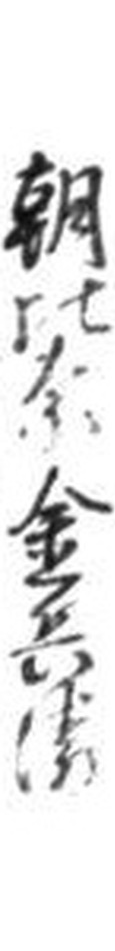朝比奈金兵衛
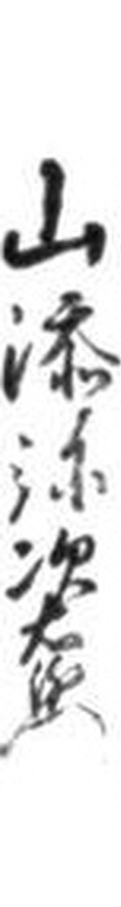山添弥次右衛門
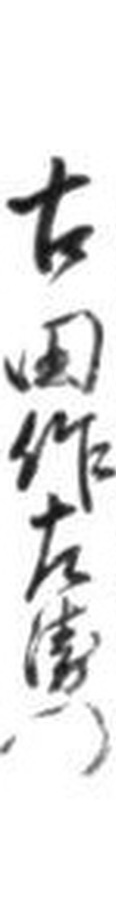古田作左衛門
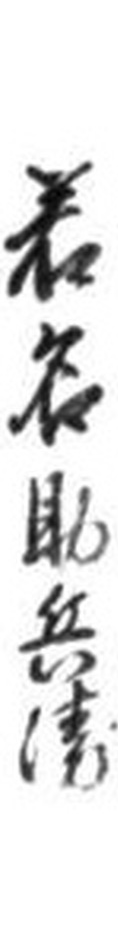若名助兵衛
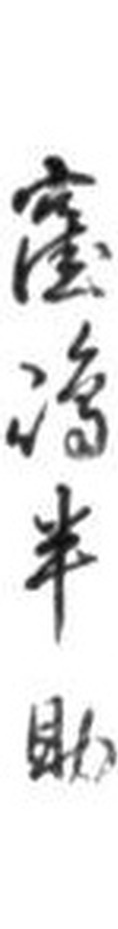窪嶋半助
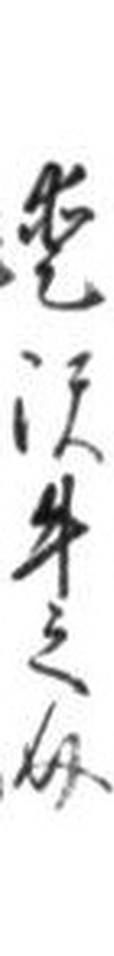愛沢牛之介
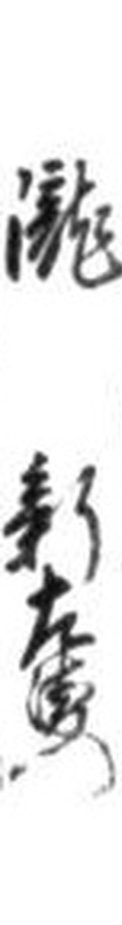瀧新左衛門
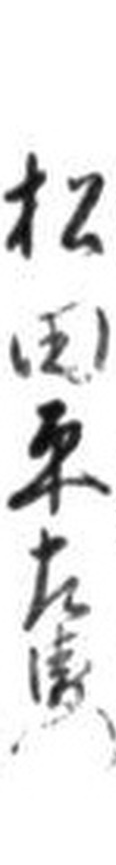松田平左衛門
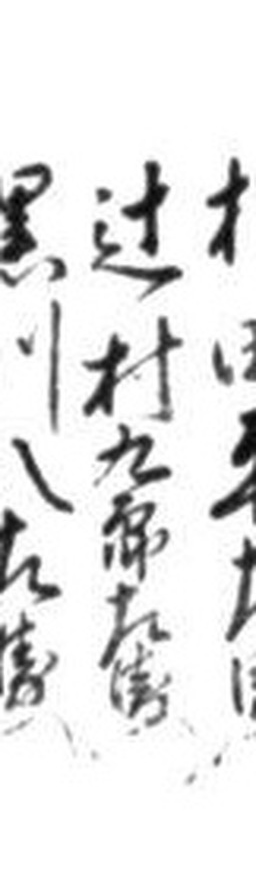黒川八左衛門
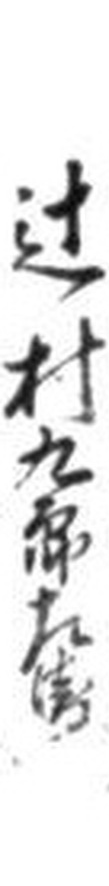辻村九郎左衛門
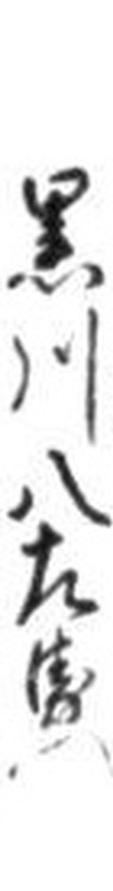黒川八左衛門
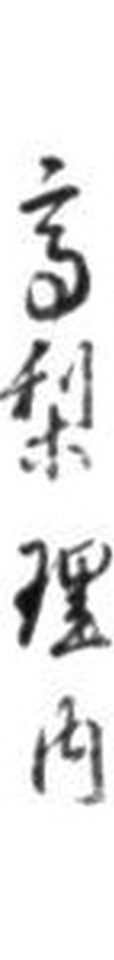高梨理内
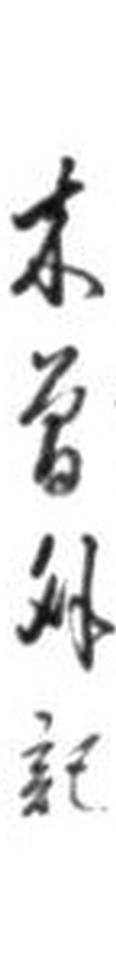木曽外記
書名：家譜 二 忠直公 従文禄四年到慶安四年
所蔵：福井県文書館 Fukui Prefectural Archives
